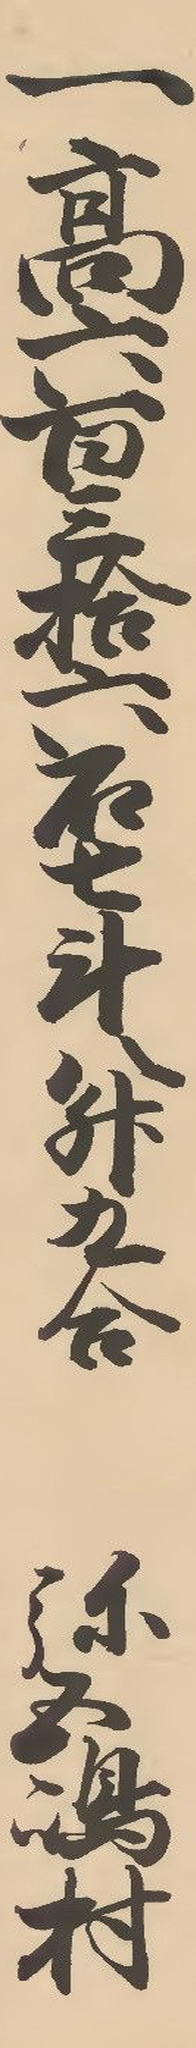一高六百三拾六石七斗八升九合弥五島村
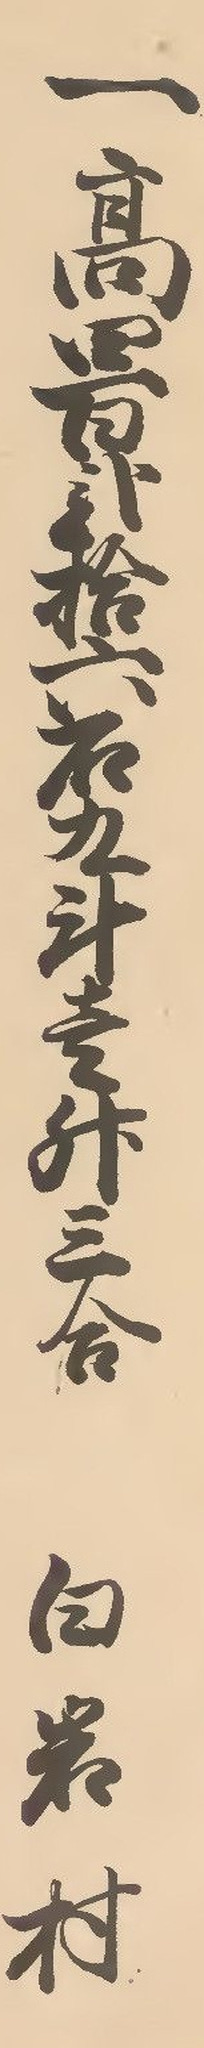一高四百弐拾六石九斗壱升三合白岩村
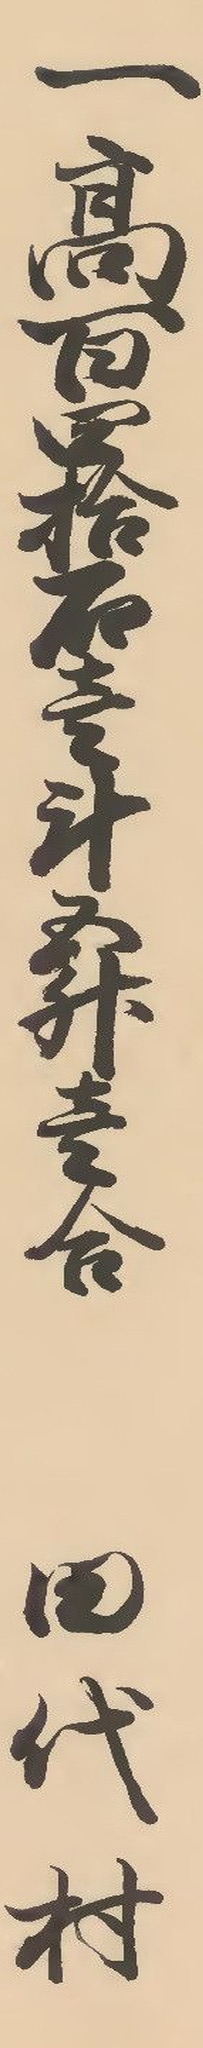一高百四拾石壱斗五升壱合田代村
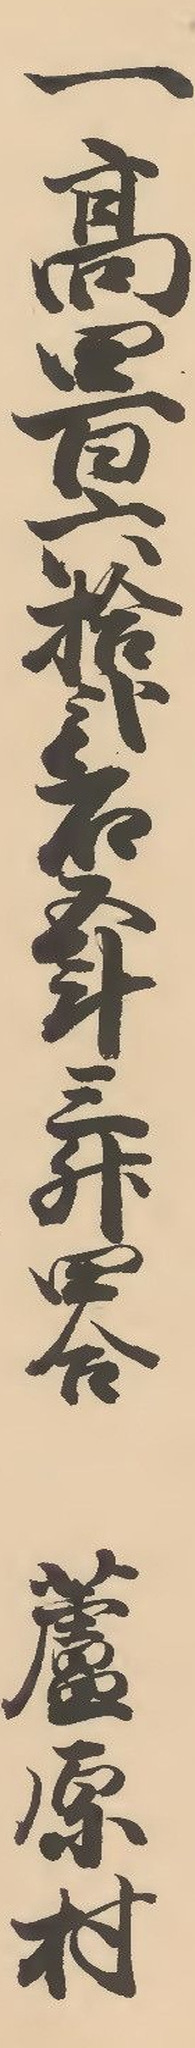一高四百六拾弐君五斗三升四合芦原村
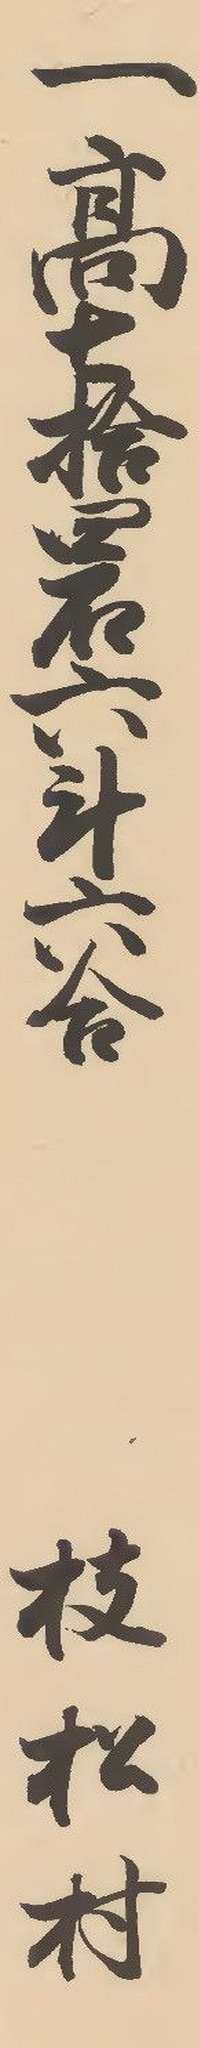一高七拾四石六斗六合枝松村

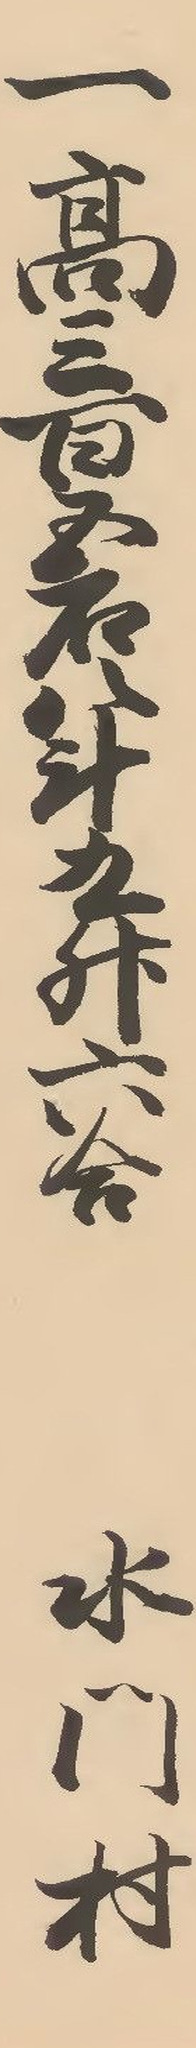一高三百五石八斗九升六合水門村
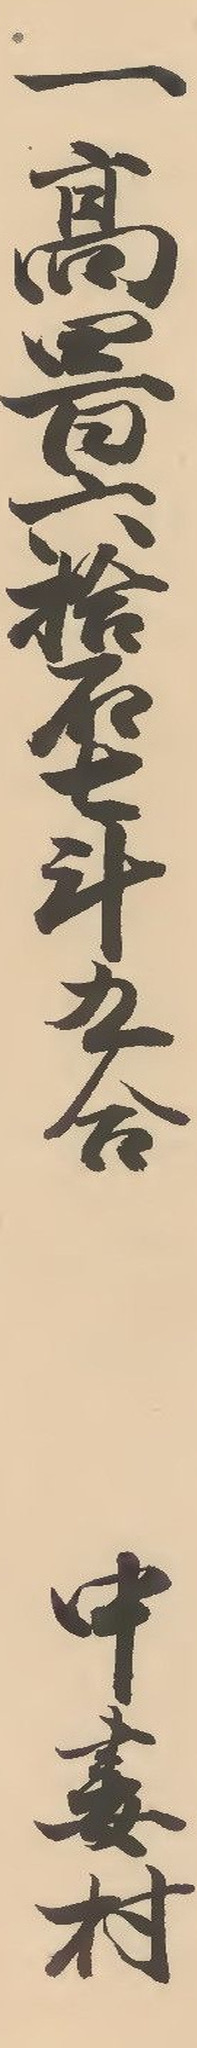一高四百六拾石七斗九合中妻村
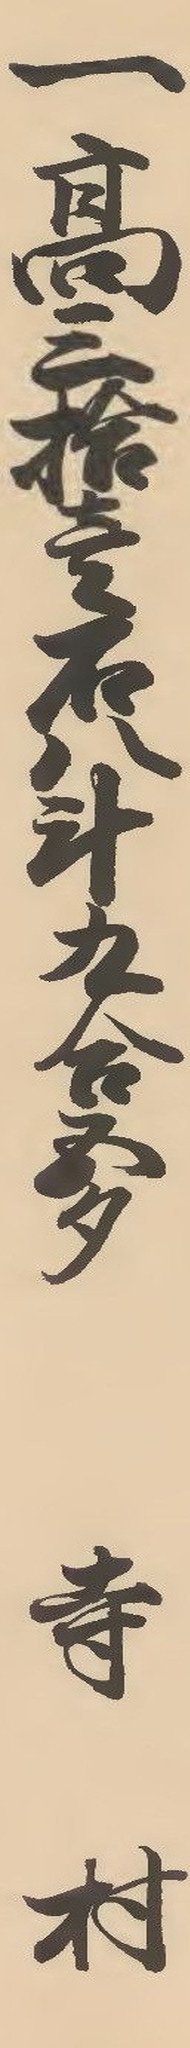一高三拾壱石八斗九合五勺寺村
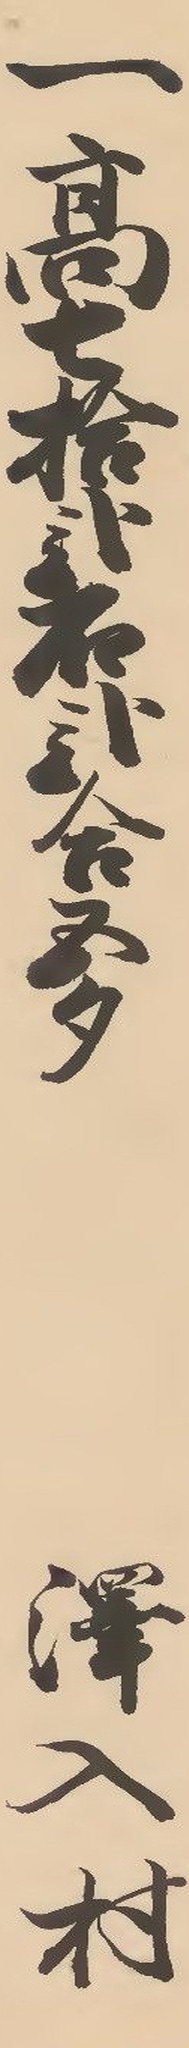一高七拾弐石弐合五勺沢入村
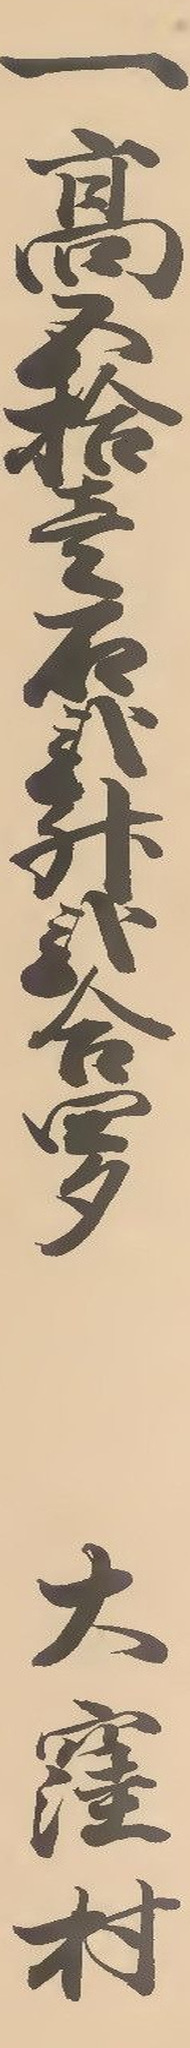一高五拾壱石弐升弐合四勺大窪村
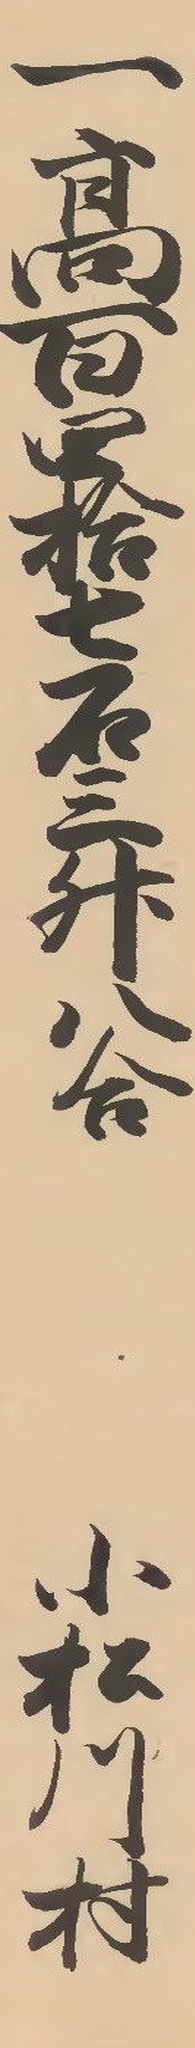一高百四拾七石三升八合小松川村
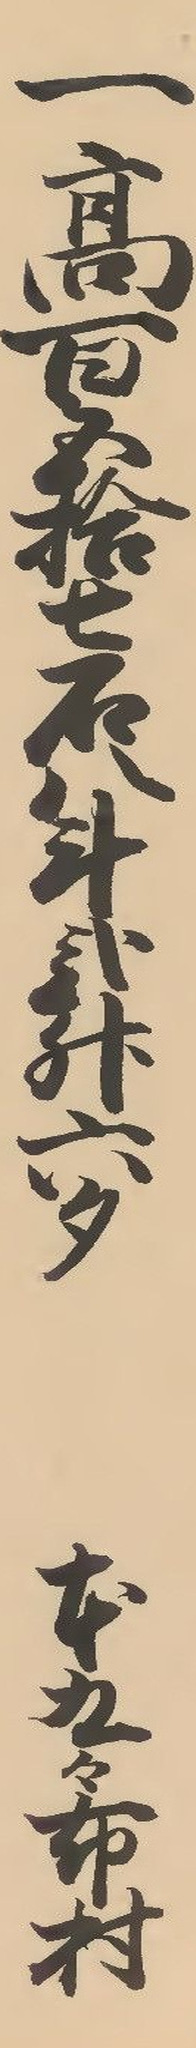一高百五拾七石八斗弐升六勺本九々布村
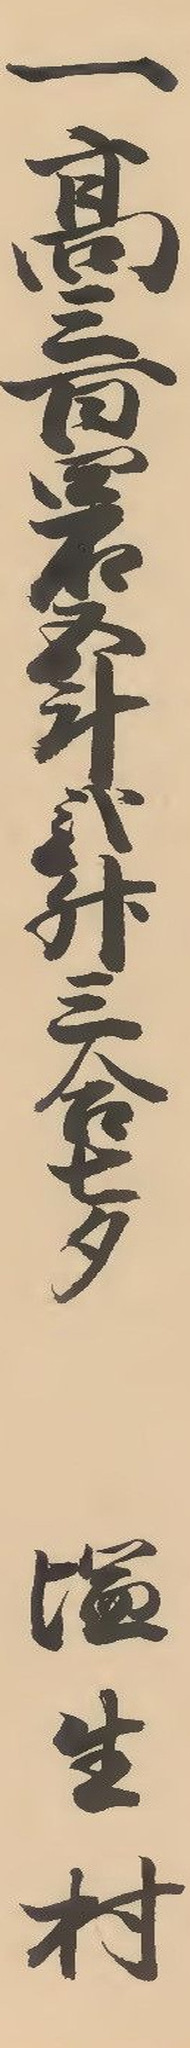一高三百四石五斗弐升三合七勺塩生村

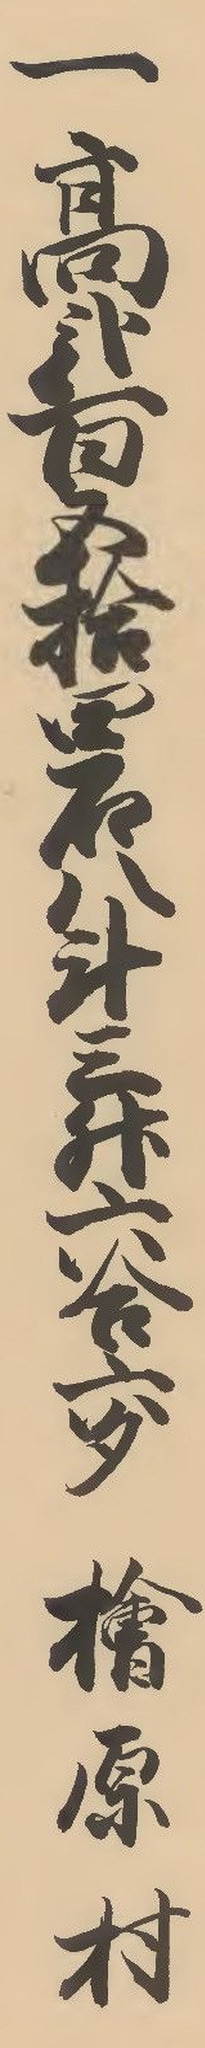一高弐百五拾四石八斗三升六合六勺桧原村
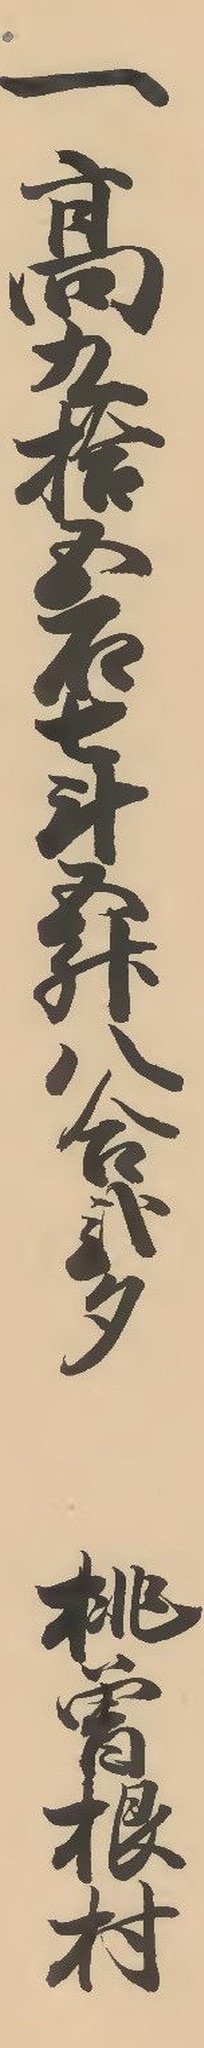一高九拾五石七斗五升八合弐勺挑曽根村
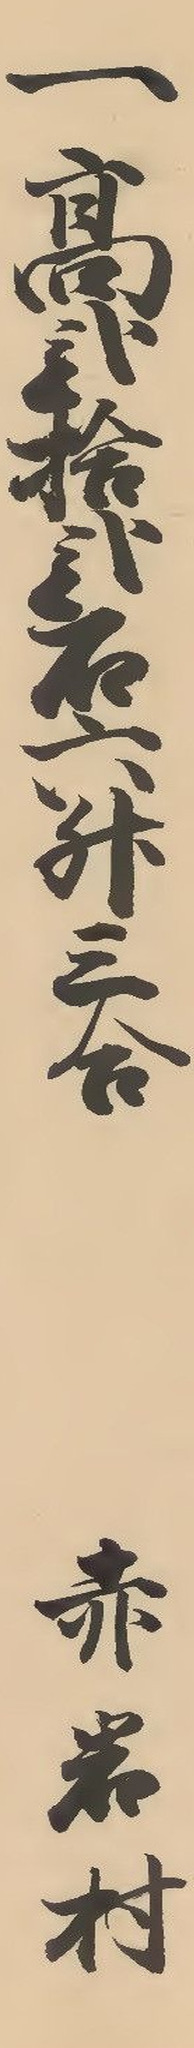一高弐拾弐石六升三合赤岩村
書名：陸奥国郷帳　１
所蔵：国立公文書館 National Archives of Japan
